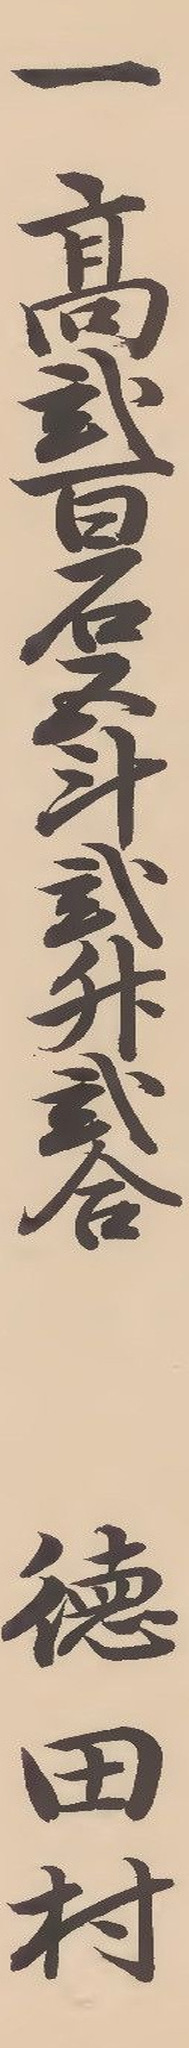一高弐百石五斗弐升弐合徳田村
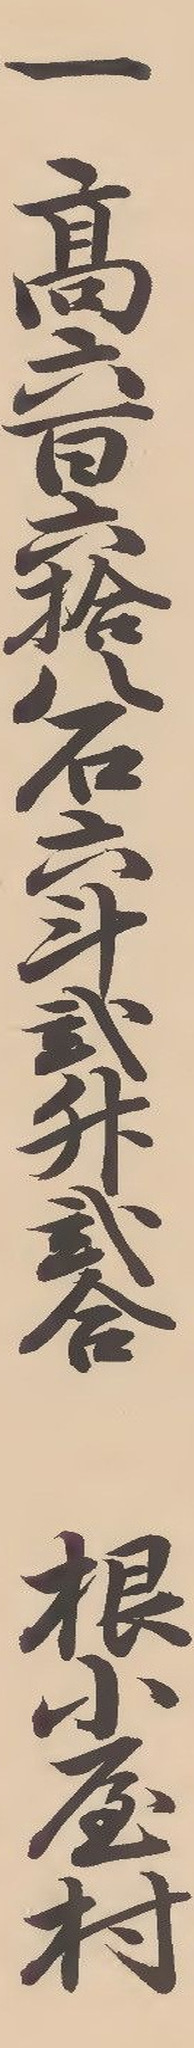一高六百六拾八石六斗弐升弐合根小屋村
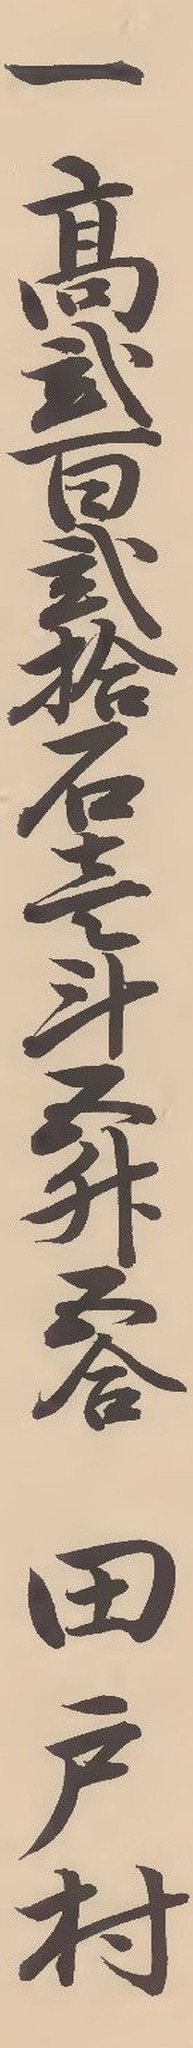一高弐百弐拾石壱斗五升五合田戸村
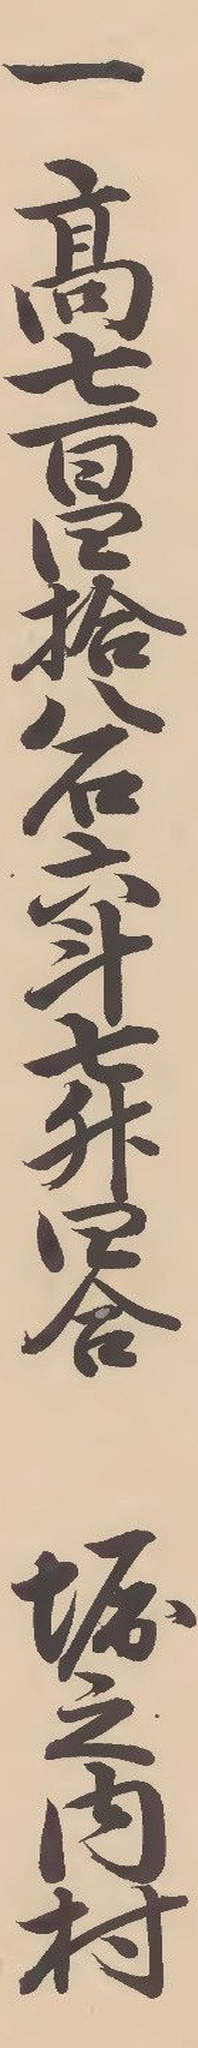一高七百四拾八石六斗七升四合堀之内村

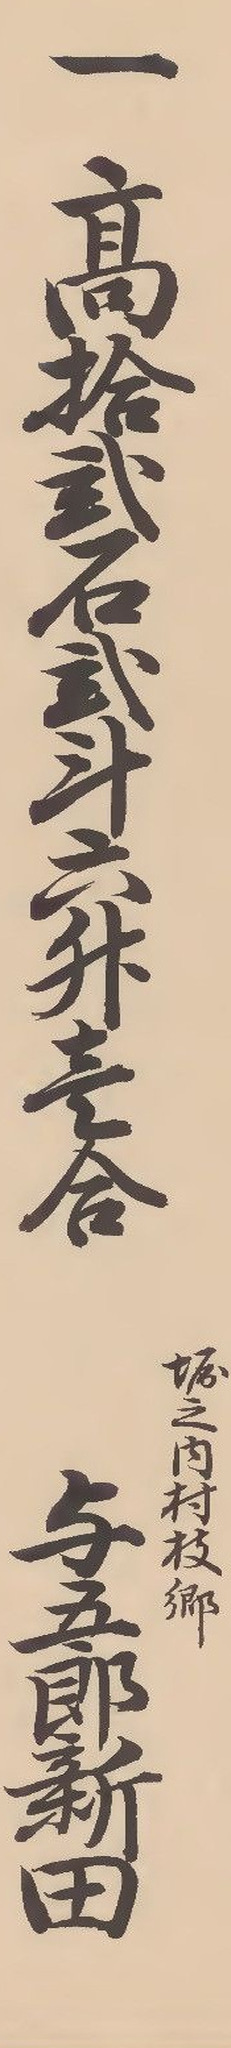一高拾弐石弐斗六升壱合与五郎新田
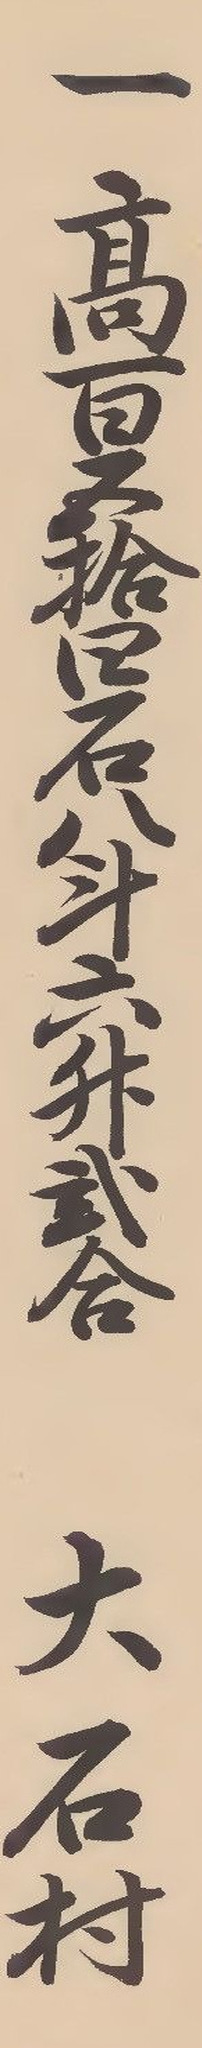一高百五拾四石八斗六升弐合大石村
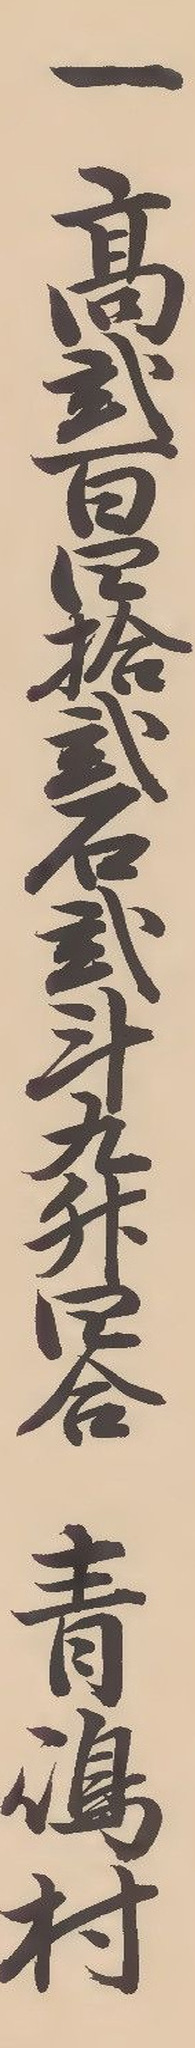一高弐百四拾弐石弐斗九升四合青島村
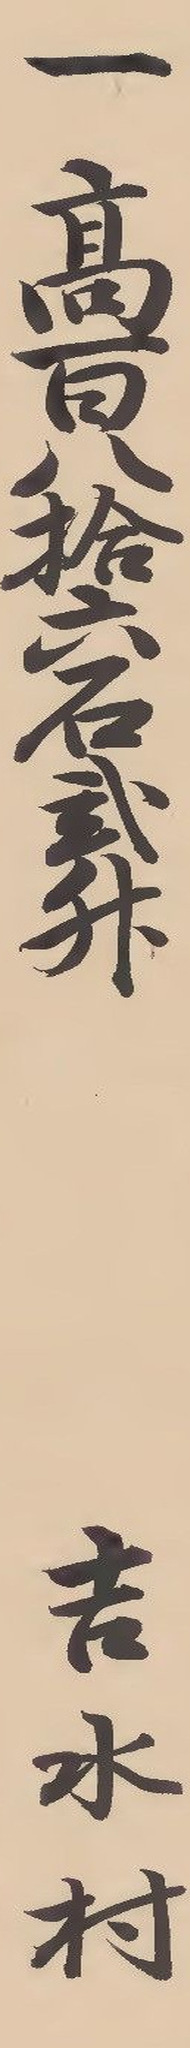一高百八拾六石弐升吉水村
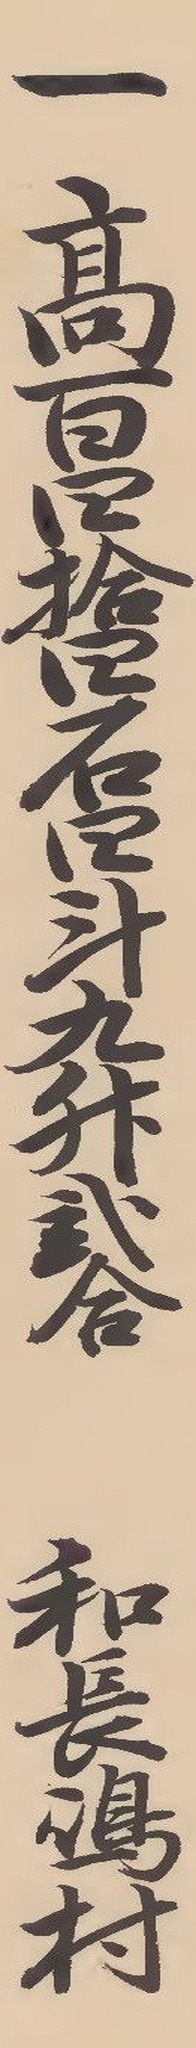一高百四拾四石四斗九升弐合和長島村
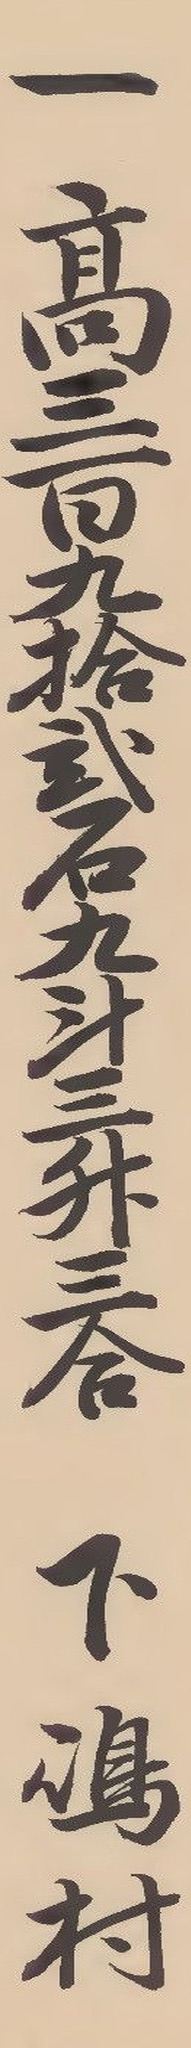一高三百九拾弐石九斗三升三合下島村
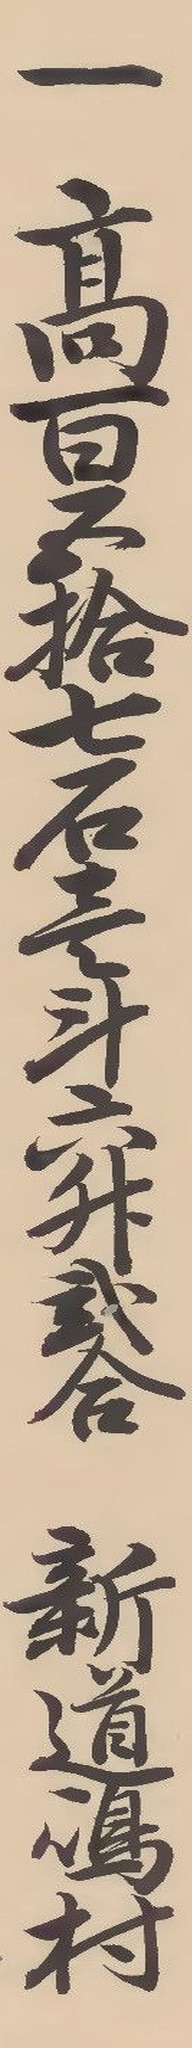一高百五拾七石壱斗六升弐合新道島村

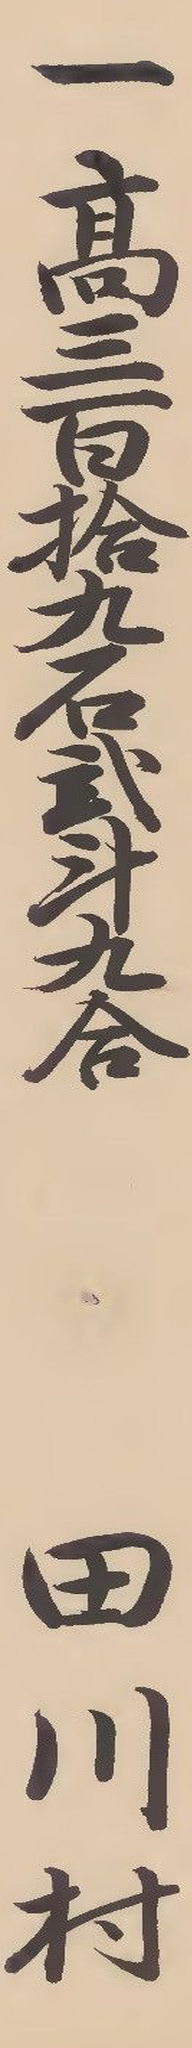一高三百拾九石弐斗九合田川村
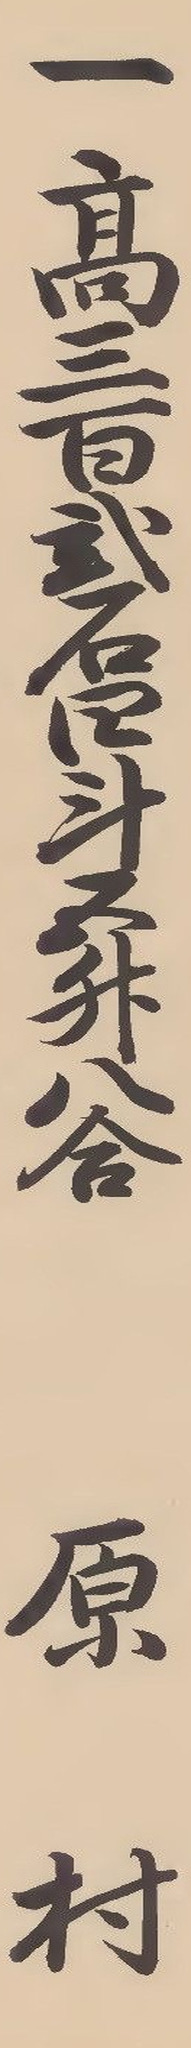一高三百弐石四斗五升八合原村
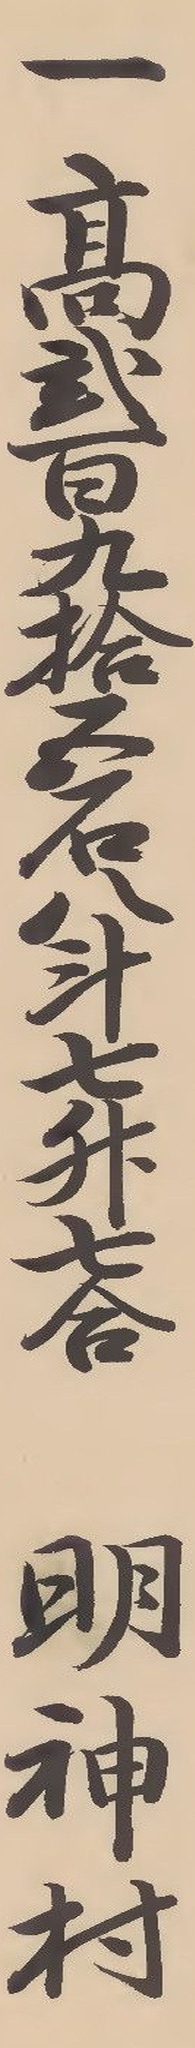一高弐百九拾五石八斗七升七合明神村
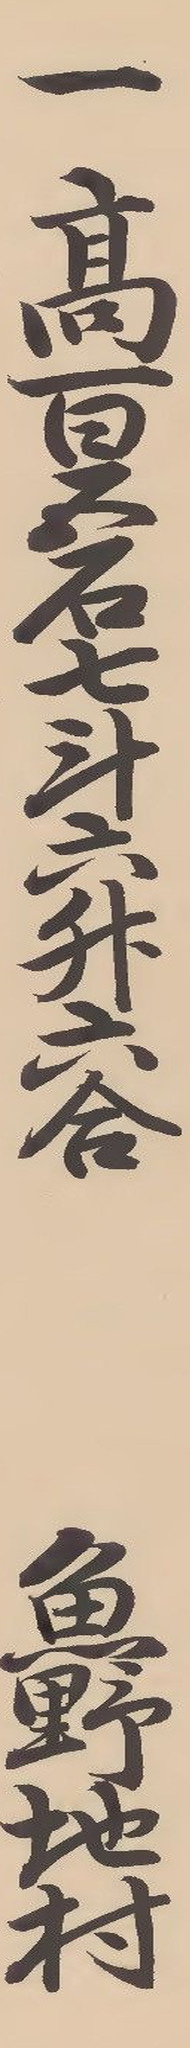一高百五石七斗六升六合魚野地村
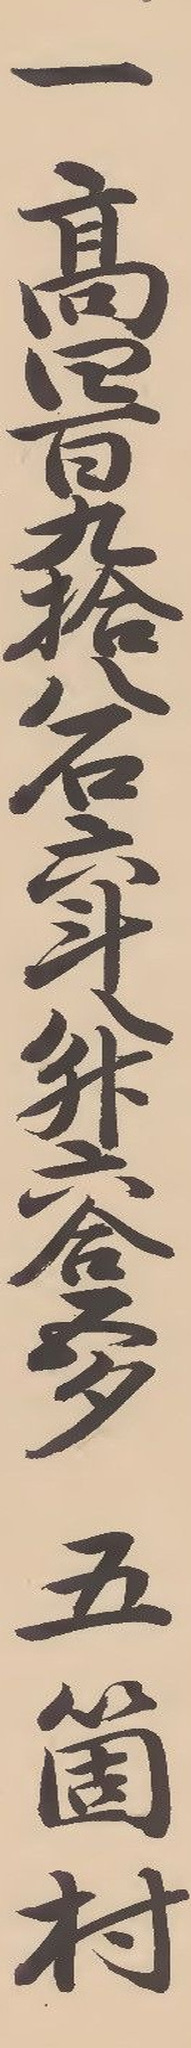一高四百九拾八石六斗八升六合五勺五箇村
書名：越後国郷帳　中
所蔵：国立公文書館 National Archives of Japan
